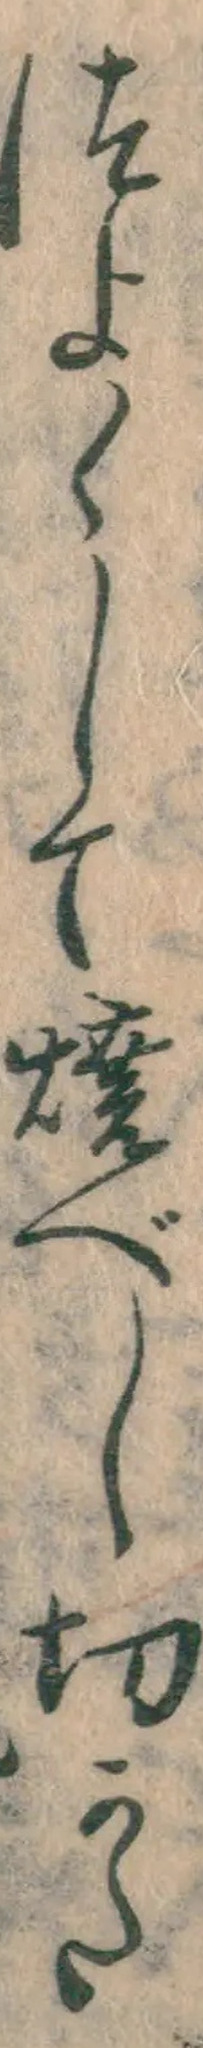つよくして焼べし切かた
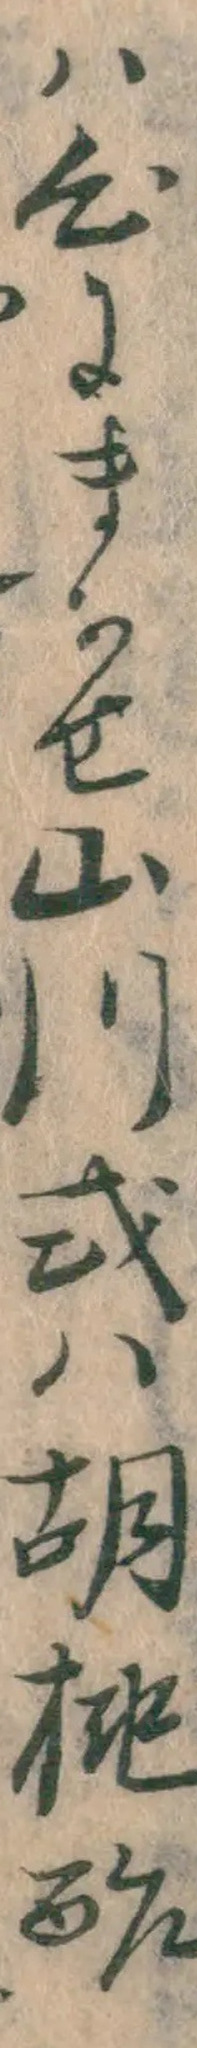は心にまかせ山川或は胡桃酢
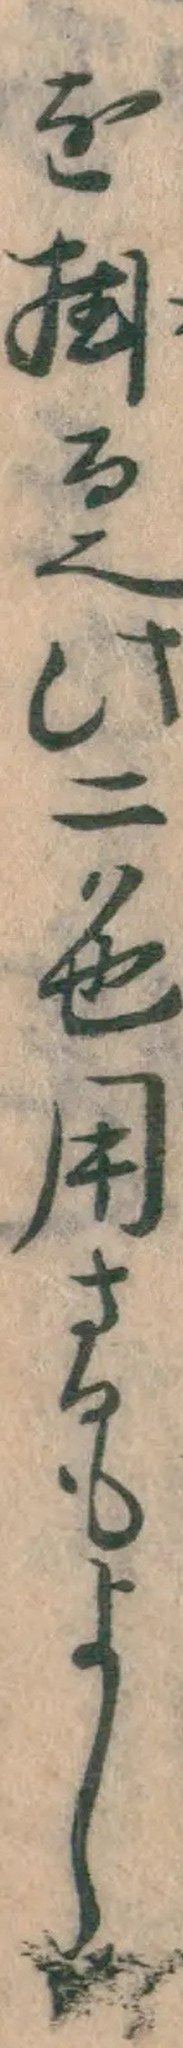を掛る也此二色用さるもよし
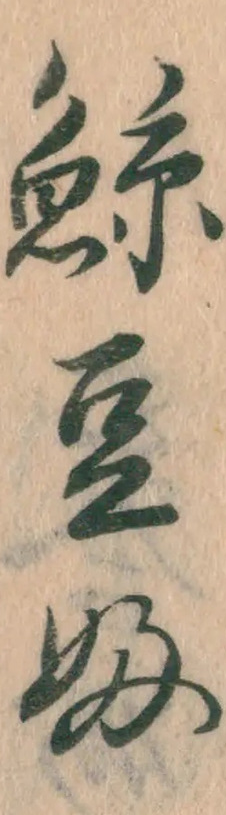鯨豆ふ
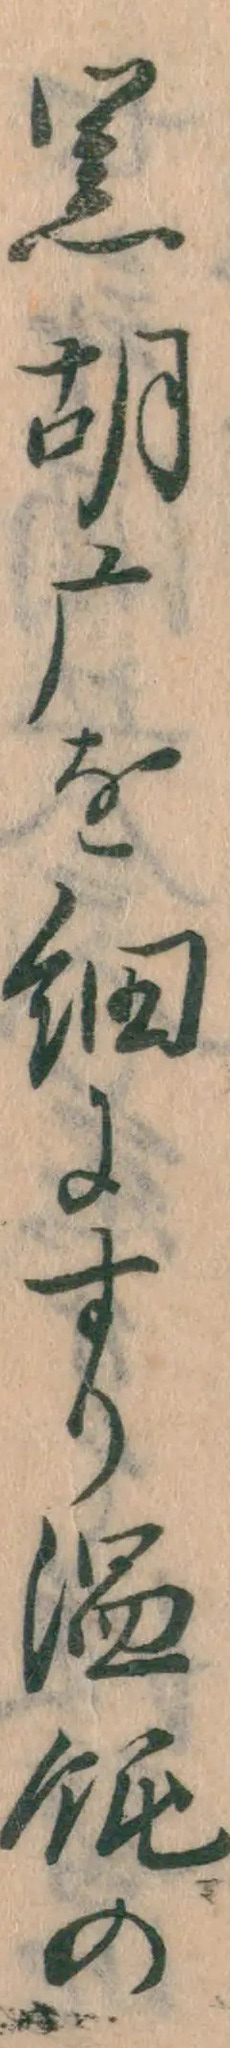黒胡麻を細にすり温飩の
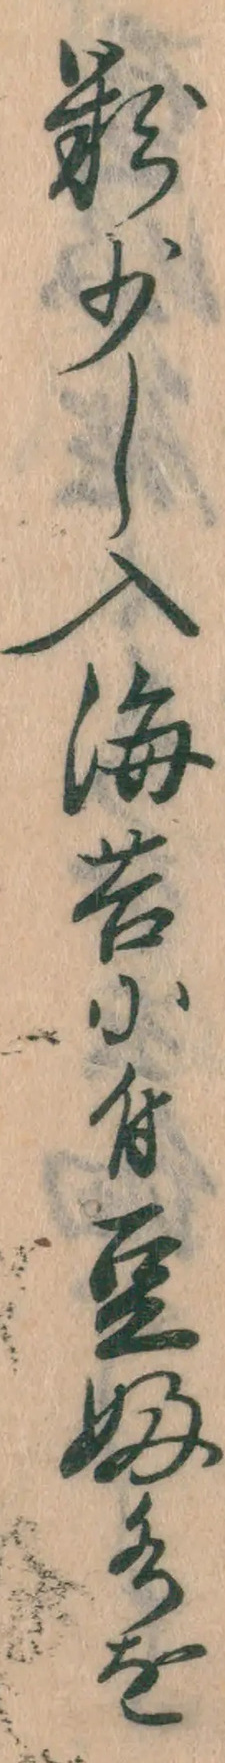粉少し入海苔に付豆ふ水を
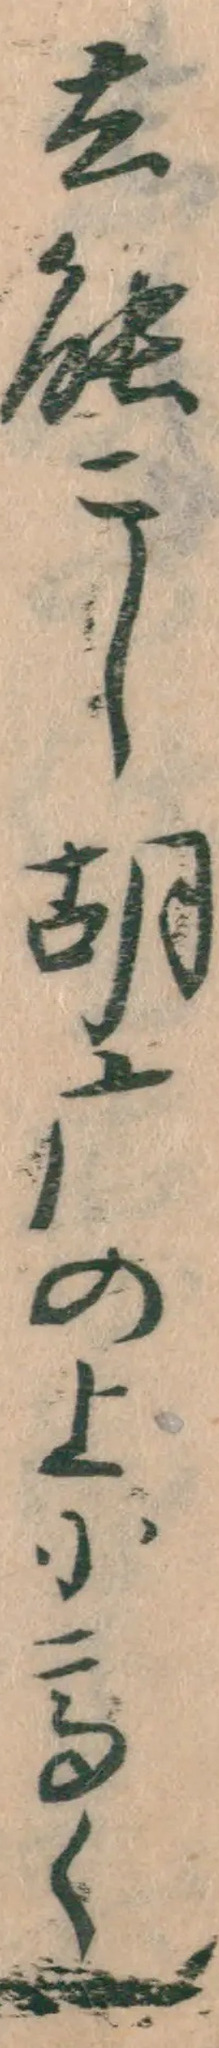去能こし胡麻の上に高く
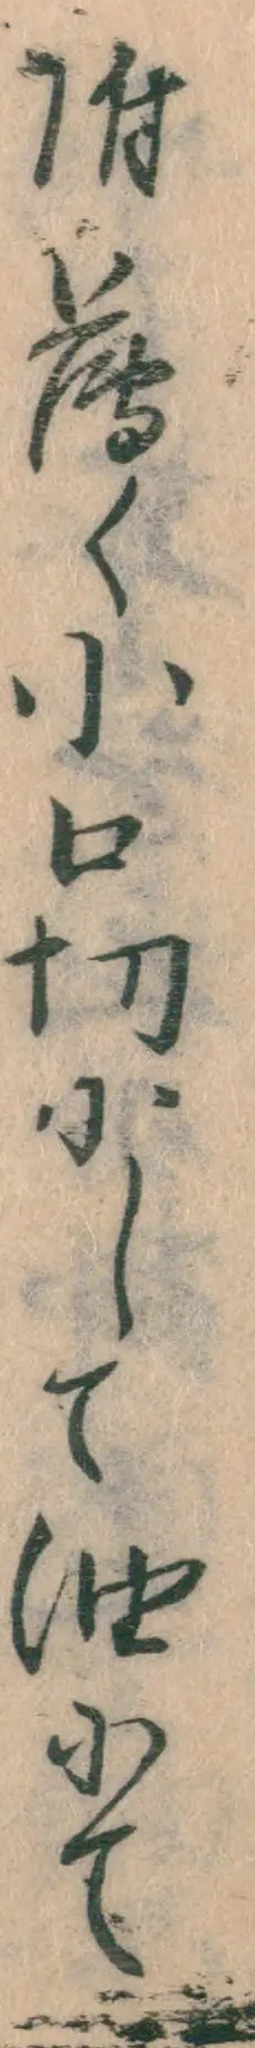附薄く小口切にして油にて
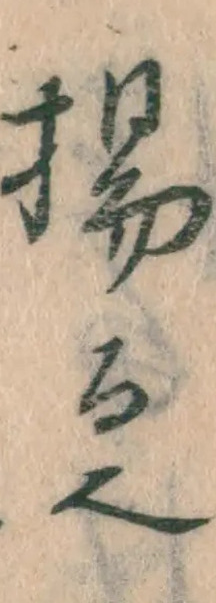揚る也
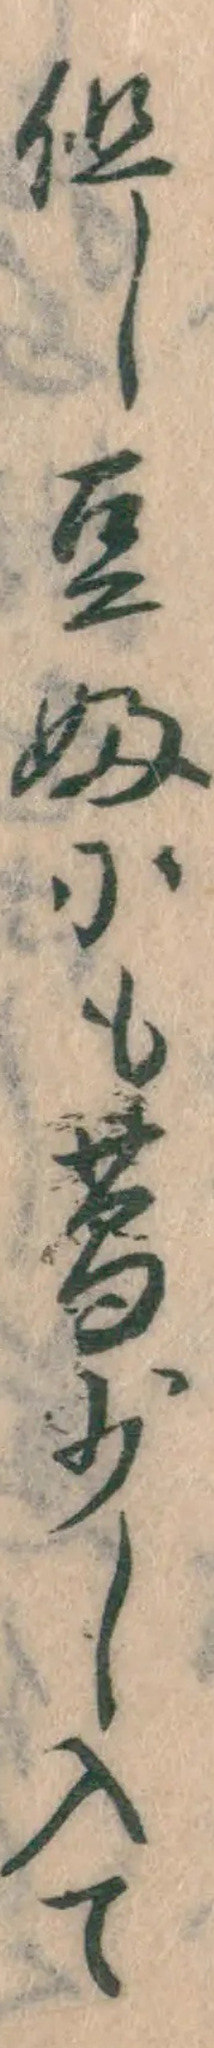但し豆ふにも葛少し入て
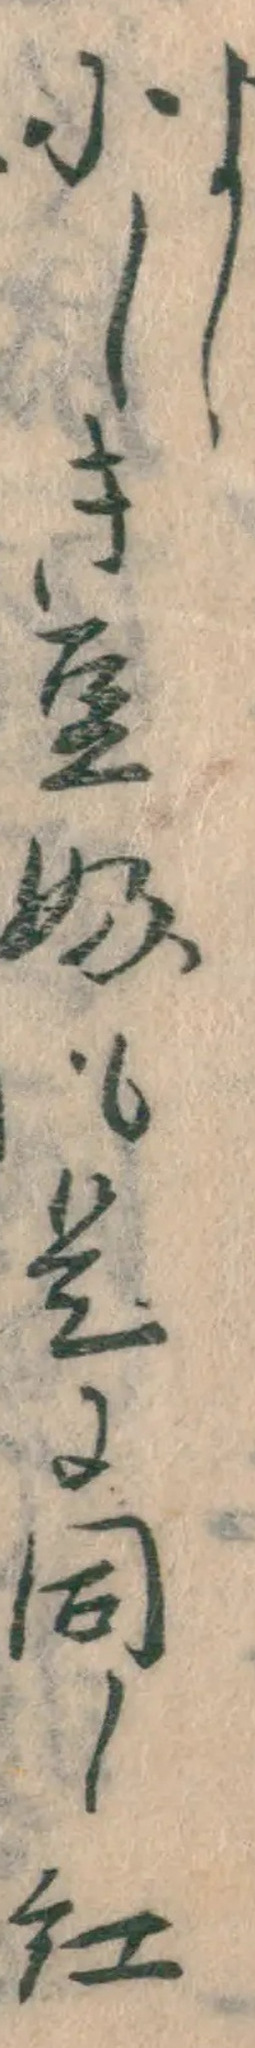にしき豆ふも是に同し紅
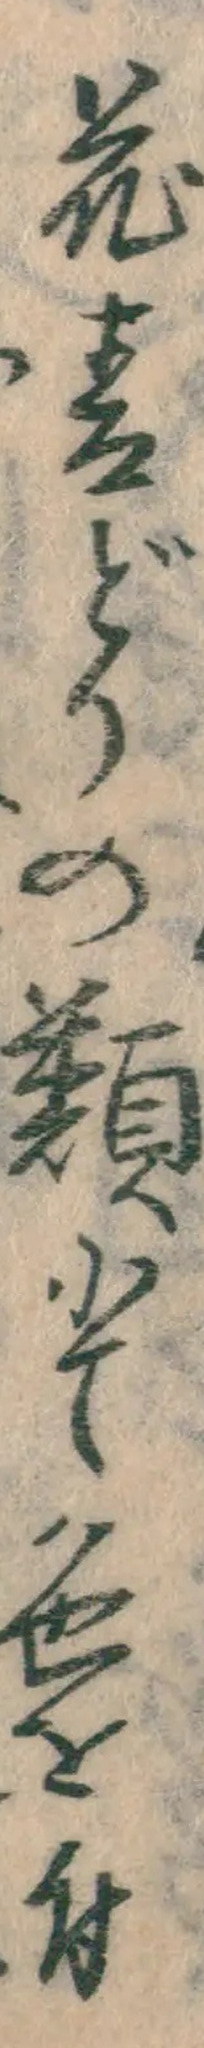花青どりの類にて色を付
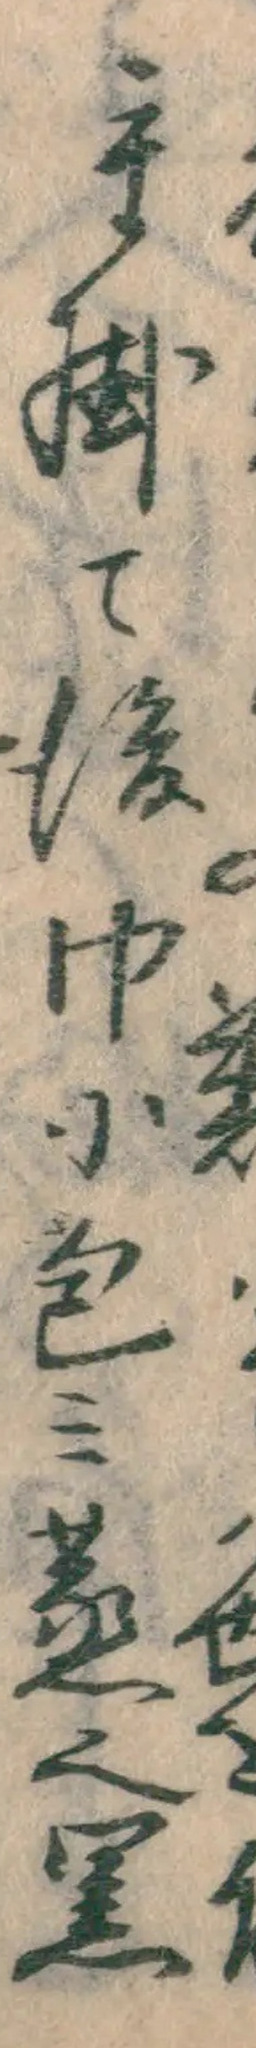重掛て後巾に包み蒸也黒
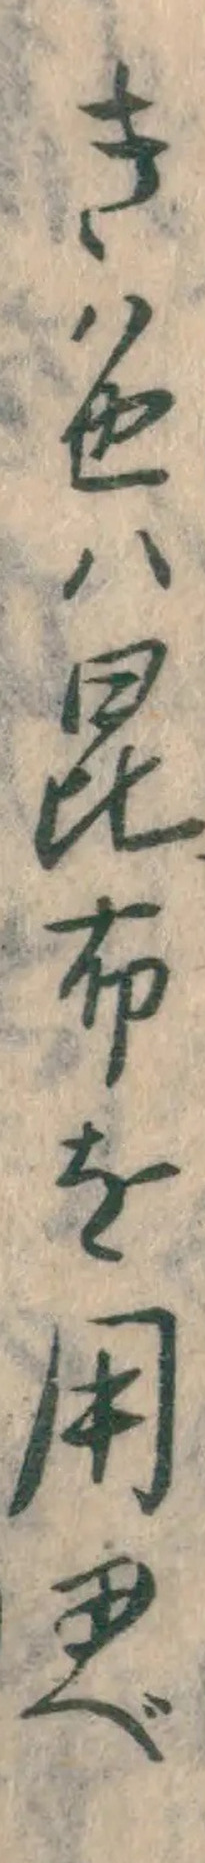き色は昆布を用ゆべし
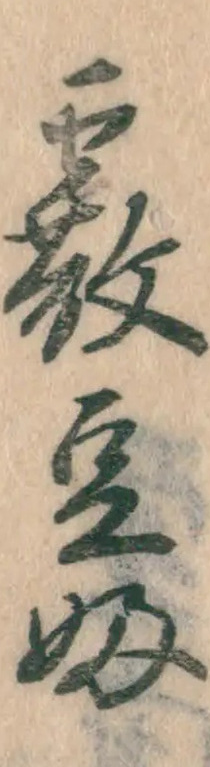霰豆ふ

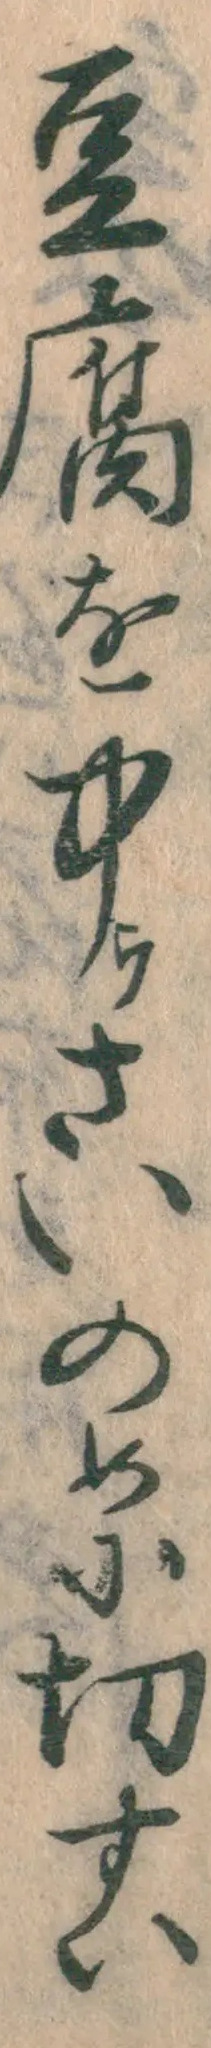豆腐を中うさいのめに切すい
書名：豆腐百珍余録
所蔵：国立国会図書館 National Diet Library, JAPAN
